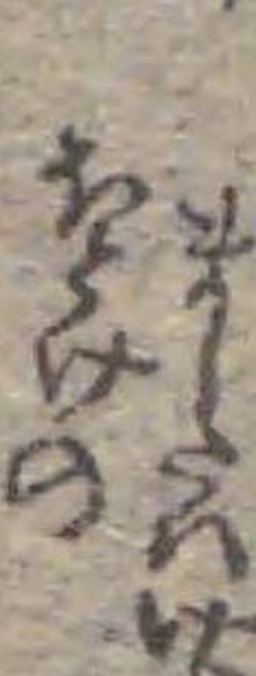ほとけの
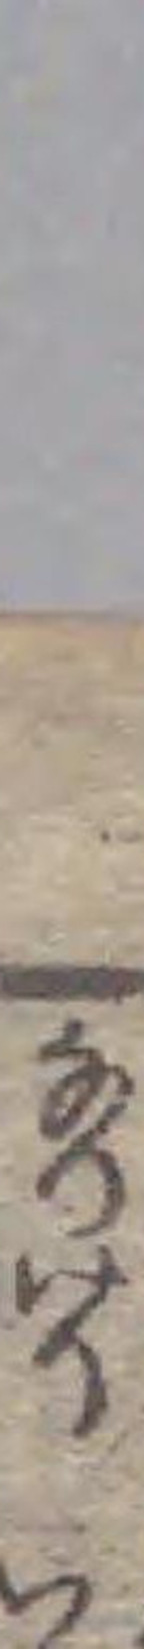なりけり
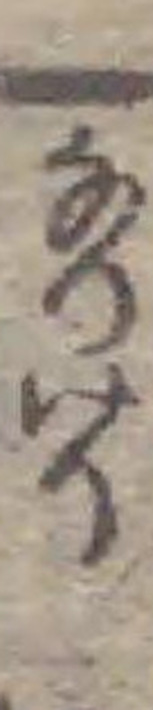なりけり
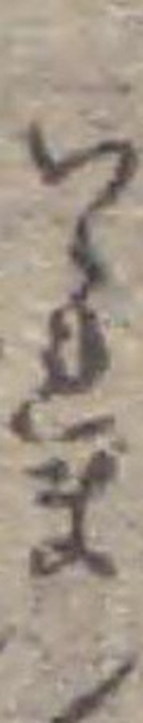いられま
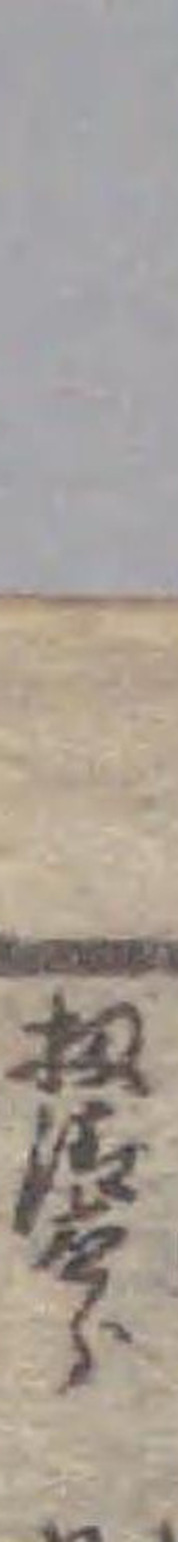扨清太郎
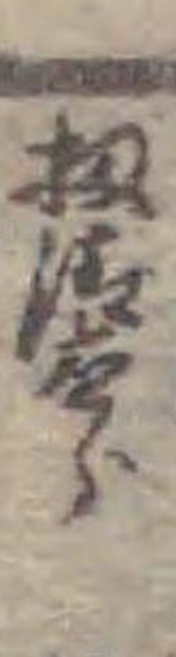扨清太郎
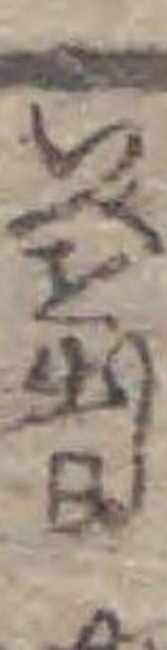いへを出し日
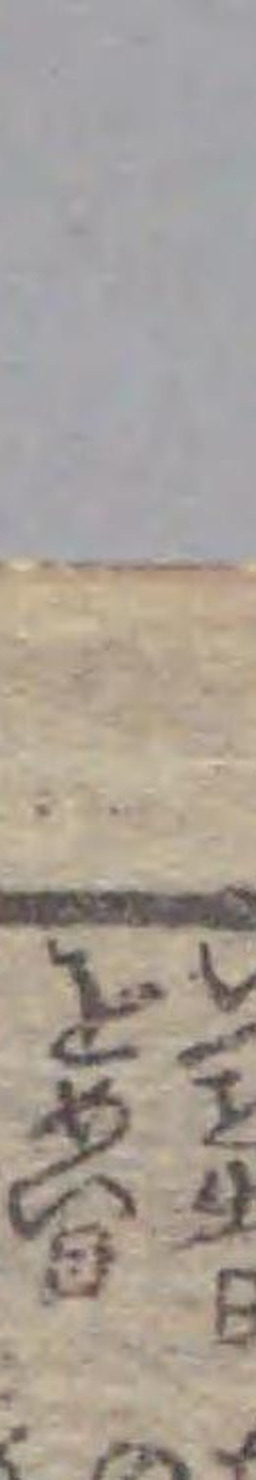をめい日
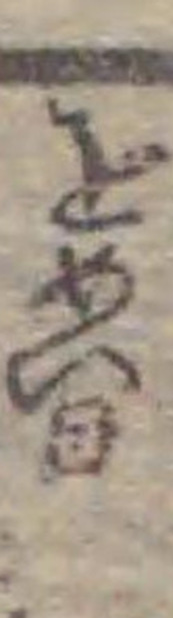をめい日
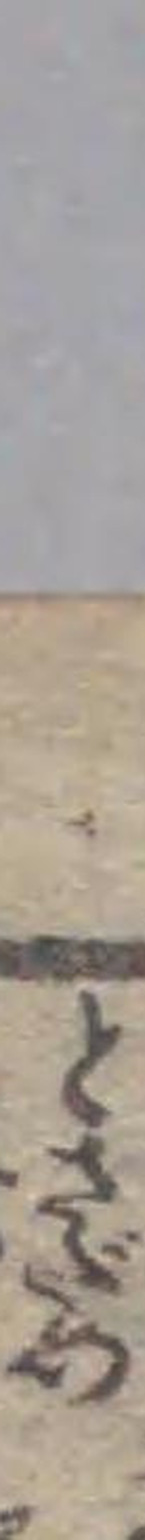とさだめ
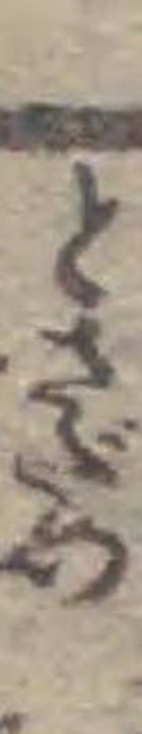とさだめ
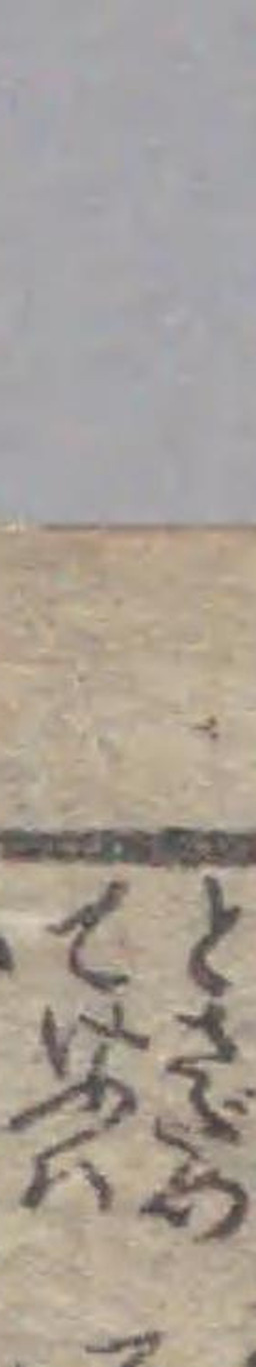てけふは
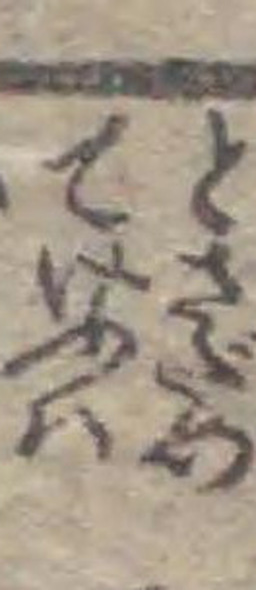てけふは
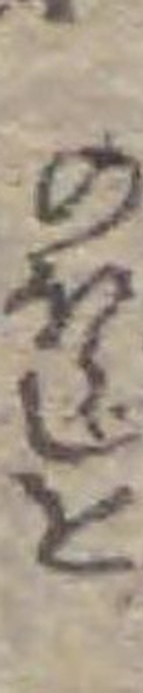のほうじを
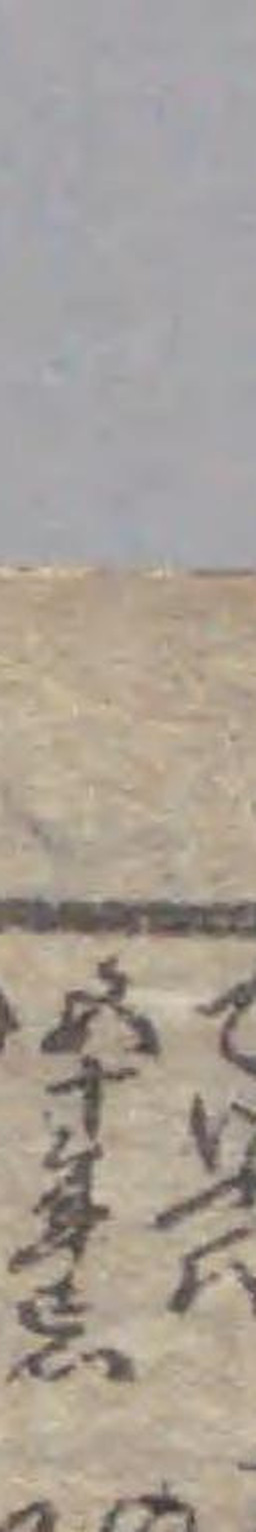五十年忌
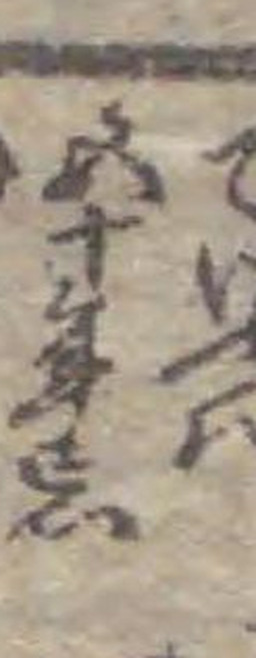五十年忌
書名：見徳一炊夢 : 3巻
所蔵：国立国会図書館 National Diet Library, JAPAN
